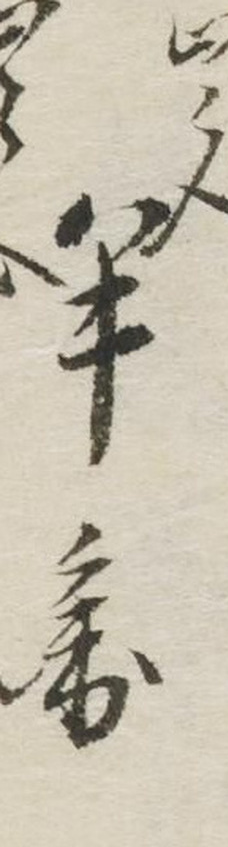半兵衛

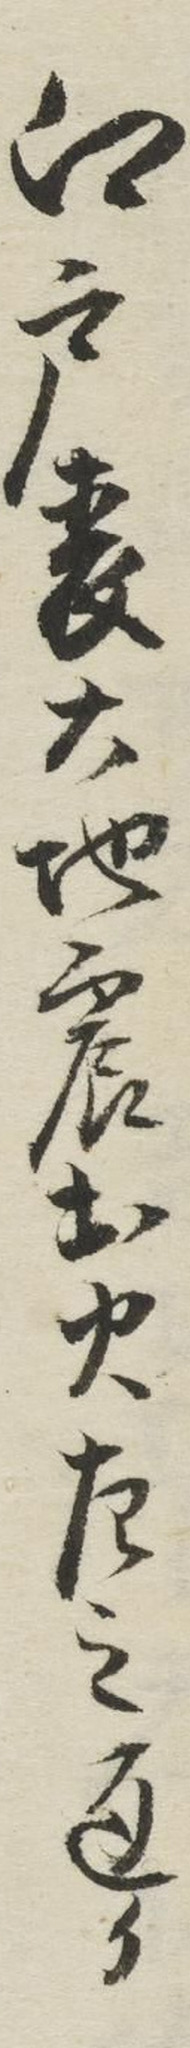江戸表大地震出火左之通り
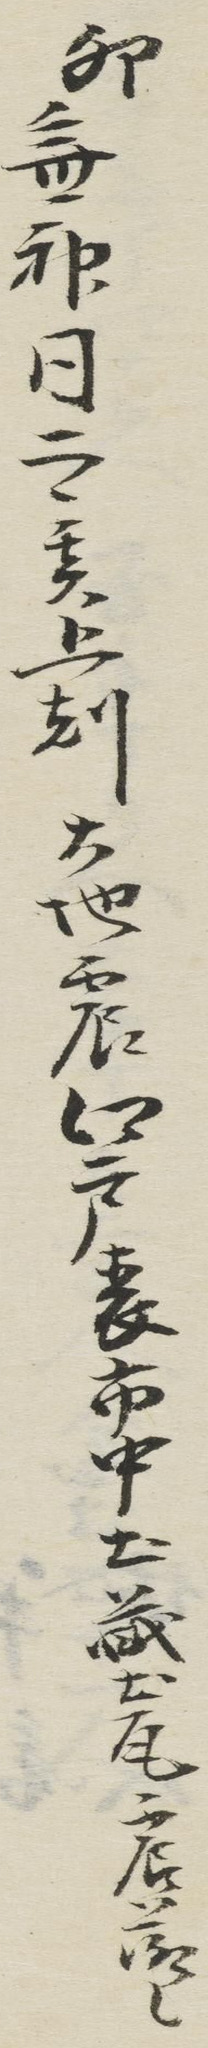無神月二日亥上刻大地震江戸表市中土蔵土瓦震落し
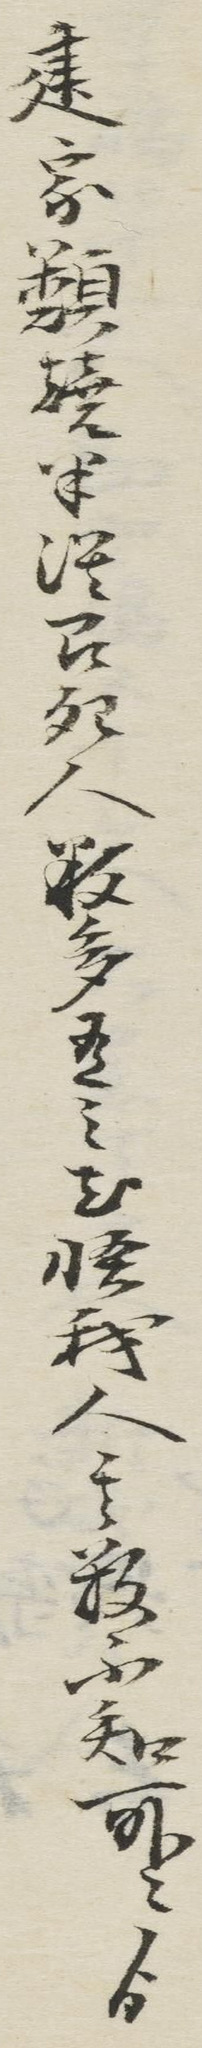建家類焼半潰即死人数多有之尤怪我人其数不知所々ゟ
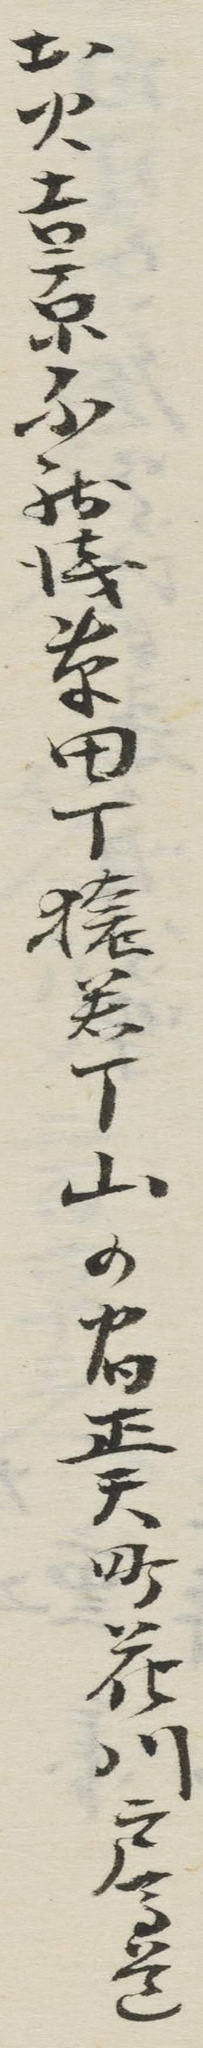出火吉原不残浅草田丁猿若丁山の宿正天町花川戸馬道
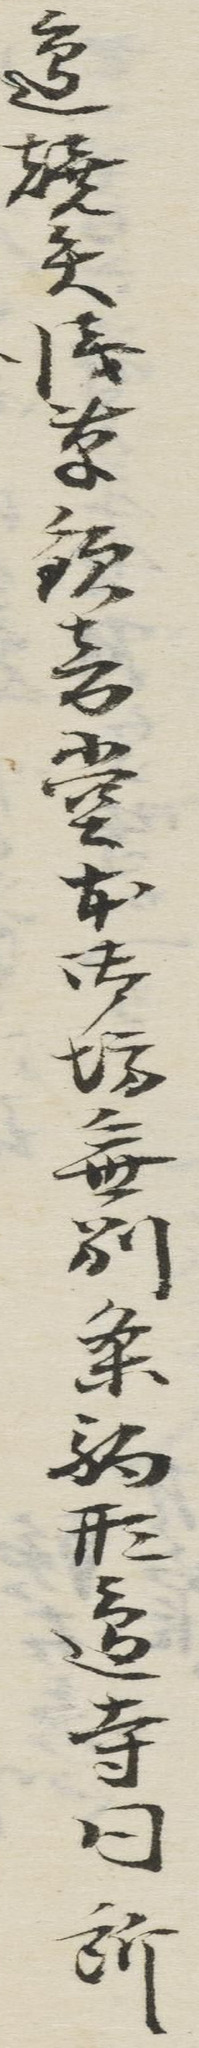辺焼失浅草観音堂本御坊無別条駒形辺寺同所
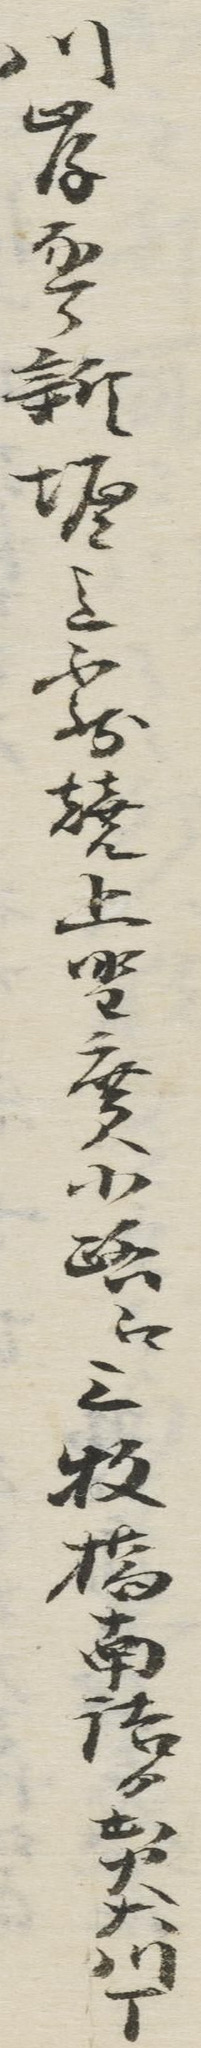川岸通り新堀迄不残焼上野広小路江三枚橋南詰ゟ出火大川丁
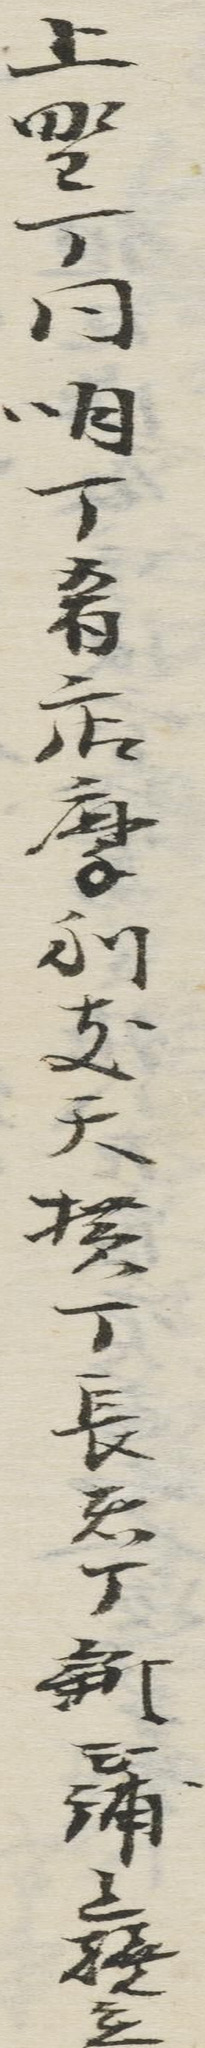上野丁同明丁肴店摩利支天横丁長者丁新屋鋪迄焼失
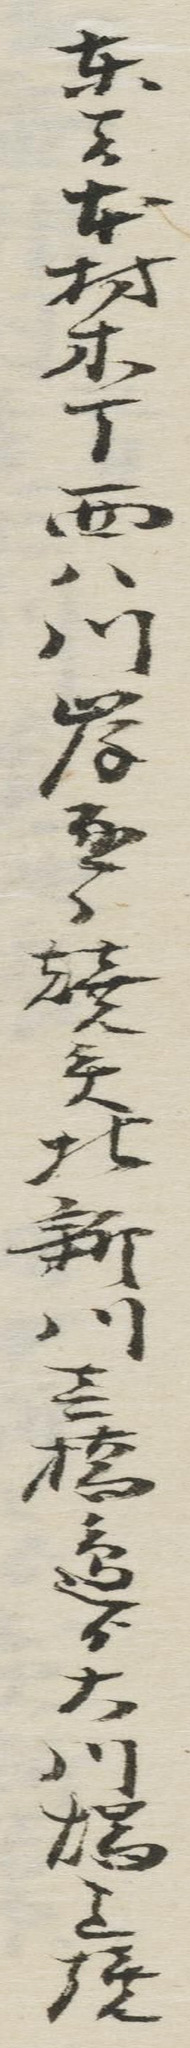下谷池之端茅丁川岸通り焼失北新川壱橋辺ゟ大川端迄焼
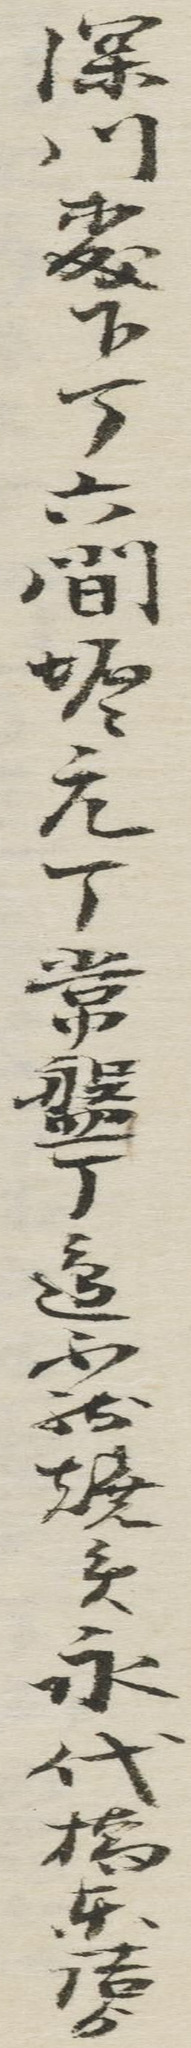深川森下丁六間堀元丁常盤丁辺不残焼失永代橋東詰ゟ
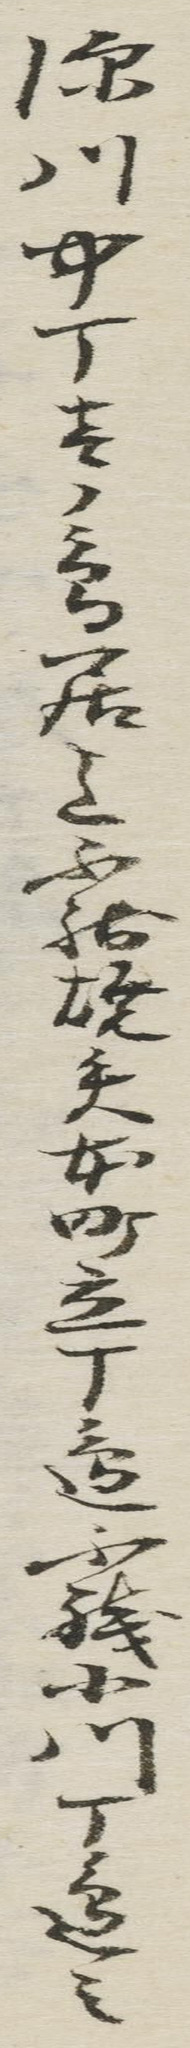深川中丁壱ノ鳥居迄不残焼失本町立丁辺不残小川丁辺之
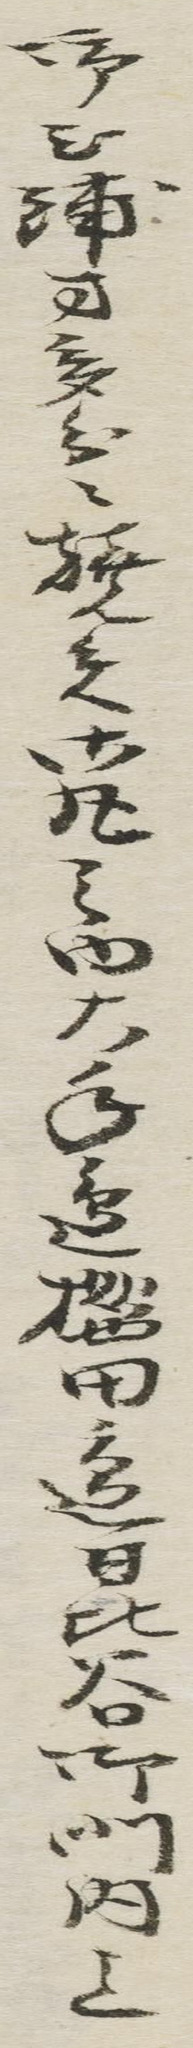御屋鋪方多分ニ焼失御丸之内大手辺桜田辺日比谷御門内迄
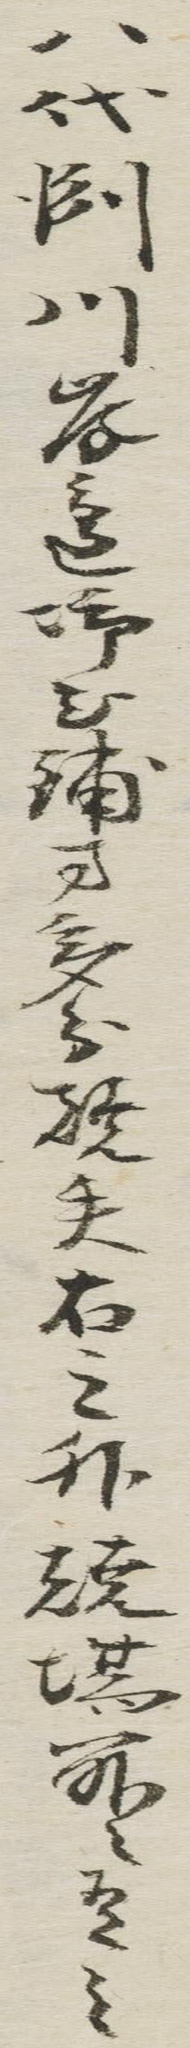八代洲川岸辺御屋鋪方多分焼失右之外焼場所ニ有之
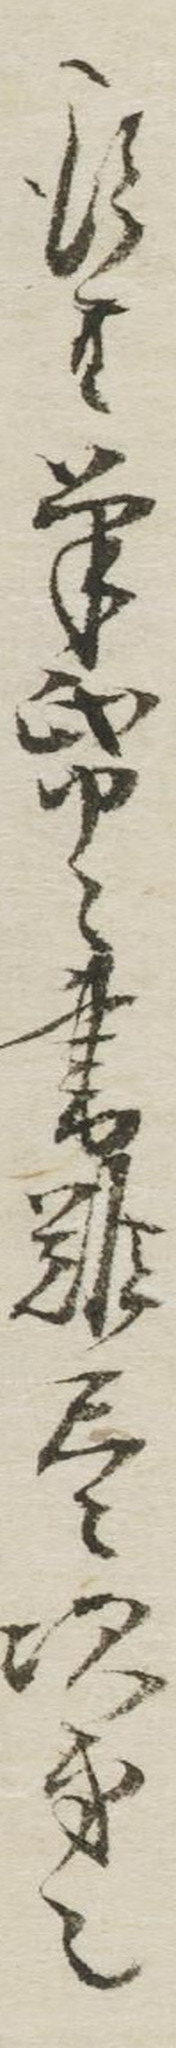候得共筆氏紙ニ書難尽次第也

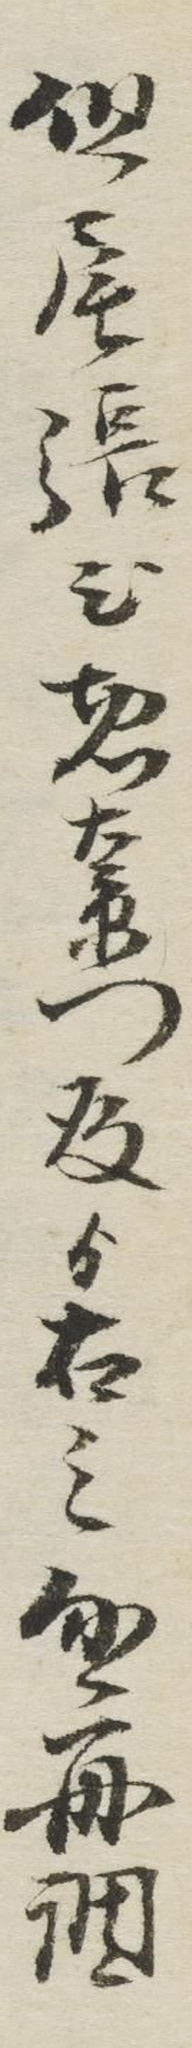但尾張屋惣右衛門殿ゟ右之通再調
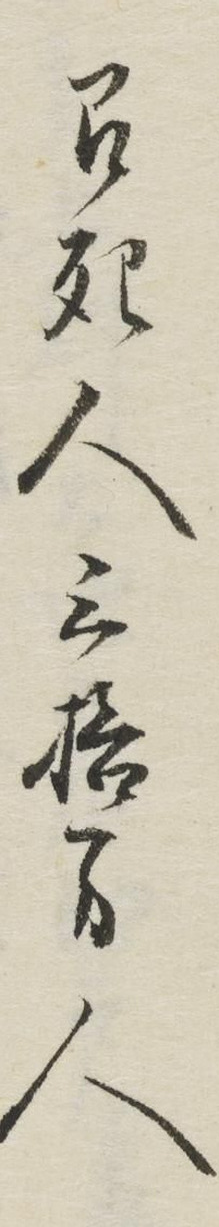即死人三拾万人
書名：諸国大地震大津波一代記
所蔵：東京大学地震研究所図書室 Earthquake Research Institute Library, The University of Tokyo, JAPAN
